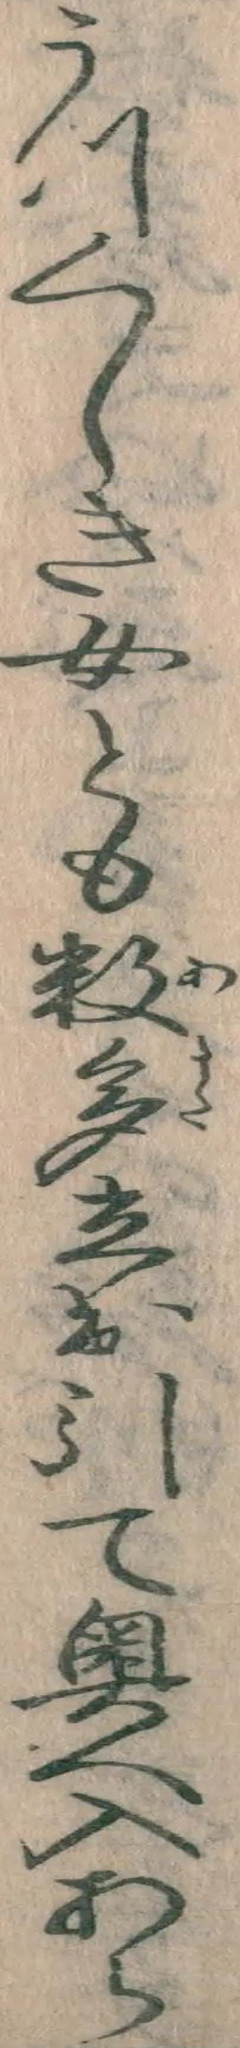うつくしき女とも数多立出引て奥へ入あら
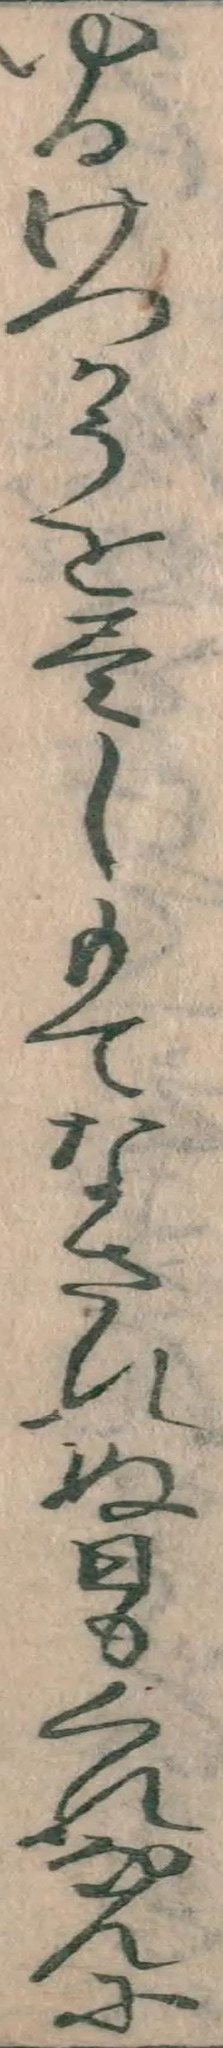ゆるけつかうを尽しもてなされぬ日もくれなんに
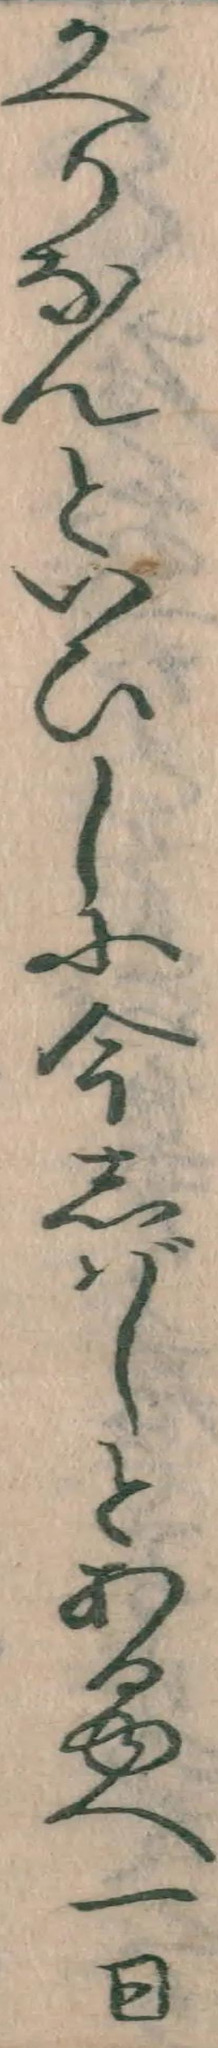かへりなんといひしに今しばしとあるゆへ一日
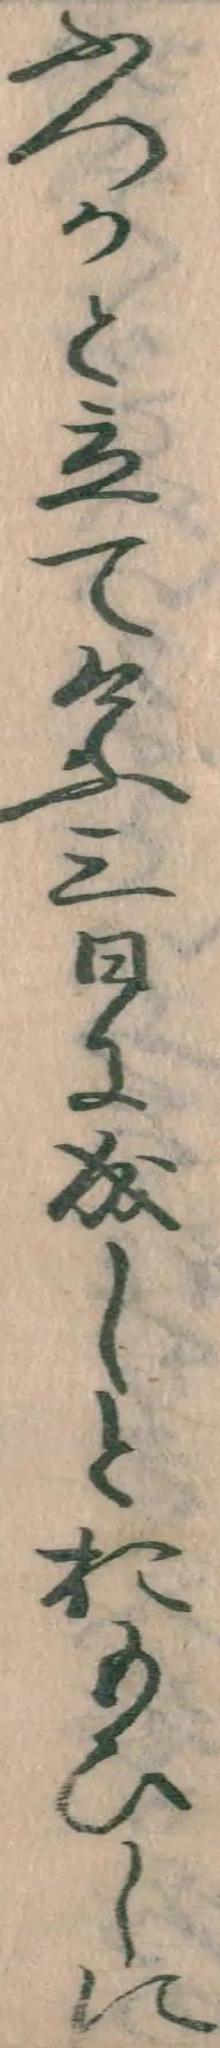ふつかと立てけふ三日に成しとおもひしに
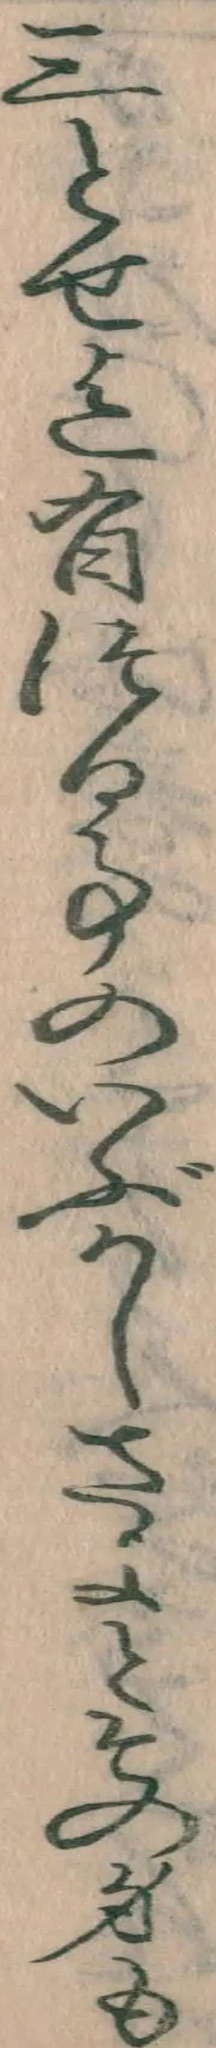三とせ迄有つる事のいぶかしさよとその身も
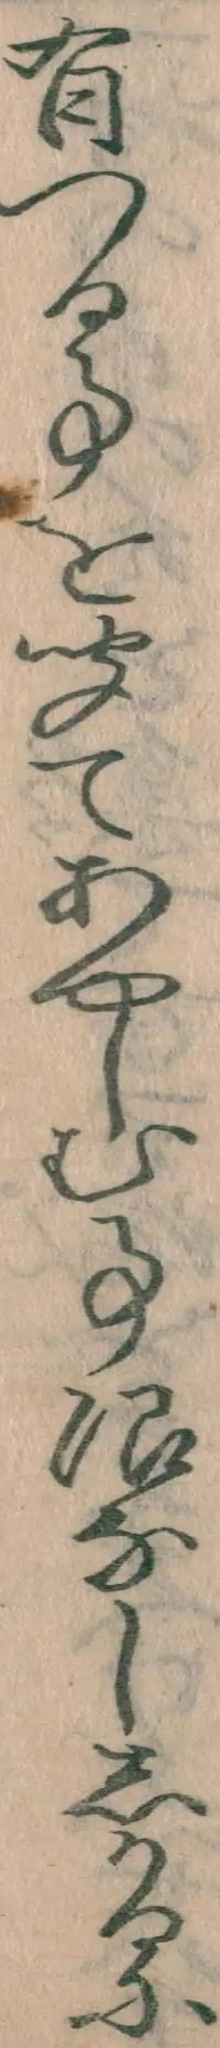有つる事を聞てあやしむ事限なししかるに
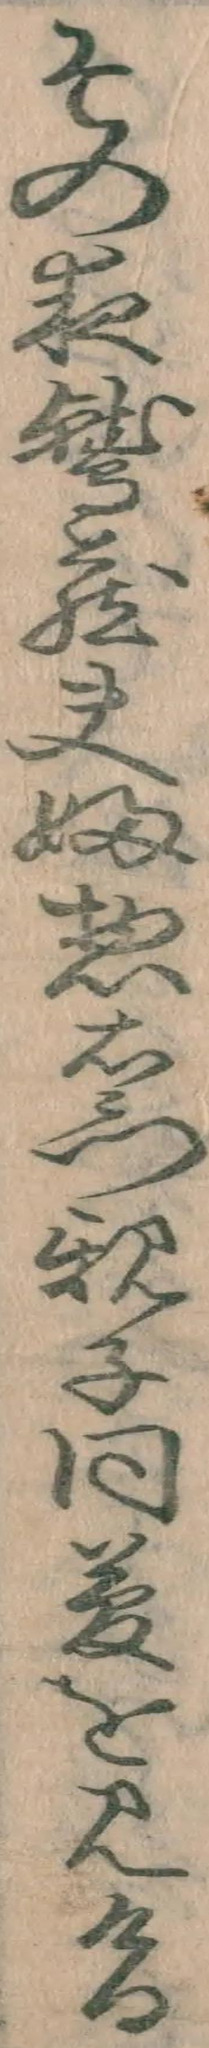その夜鷲蔵夫婦惣右衛門親子同夢を見ける
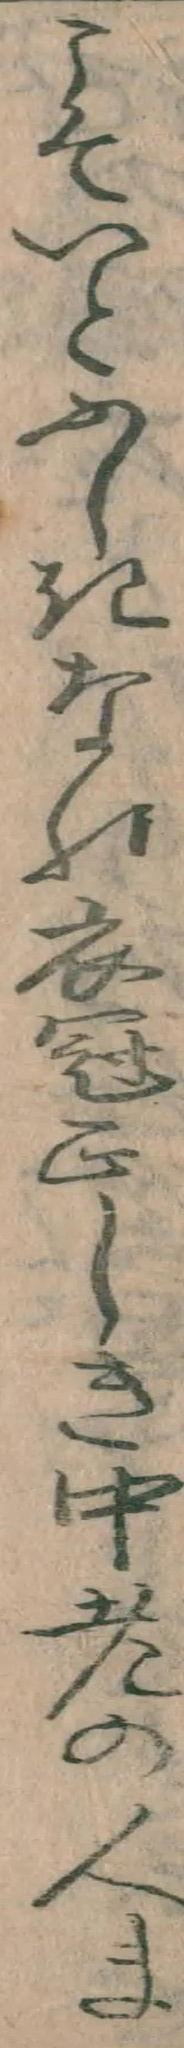こそいとふしきなれ衣冠正しき中老の人ま
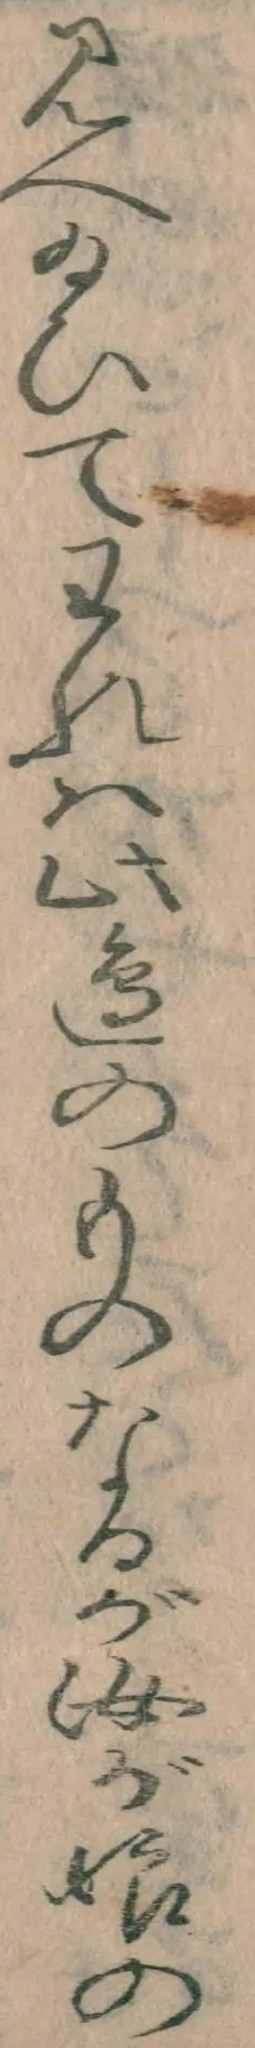みへ給ひてわれは此辺のものなるが汝が娘の
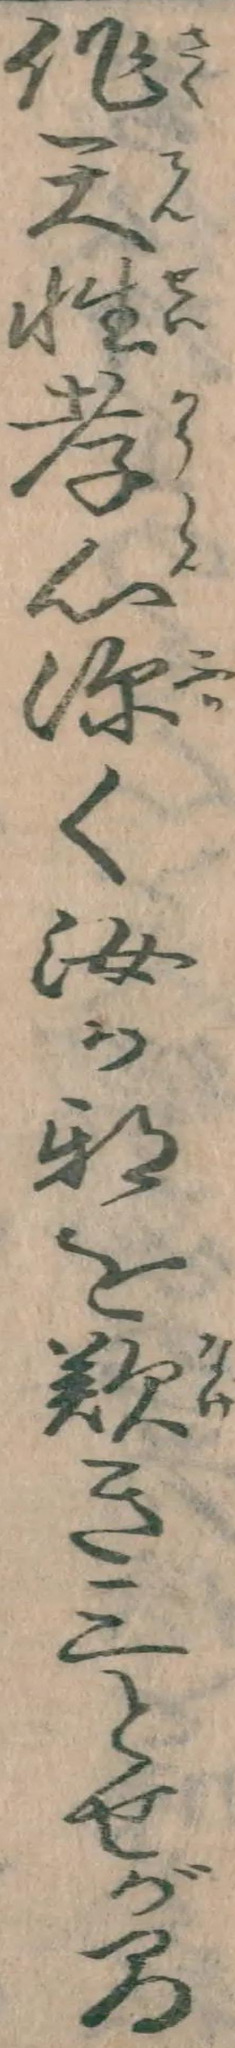作天性孝心深く汝が親を邪を歎き三とせが間
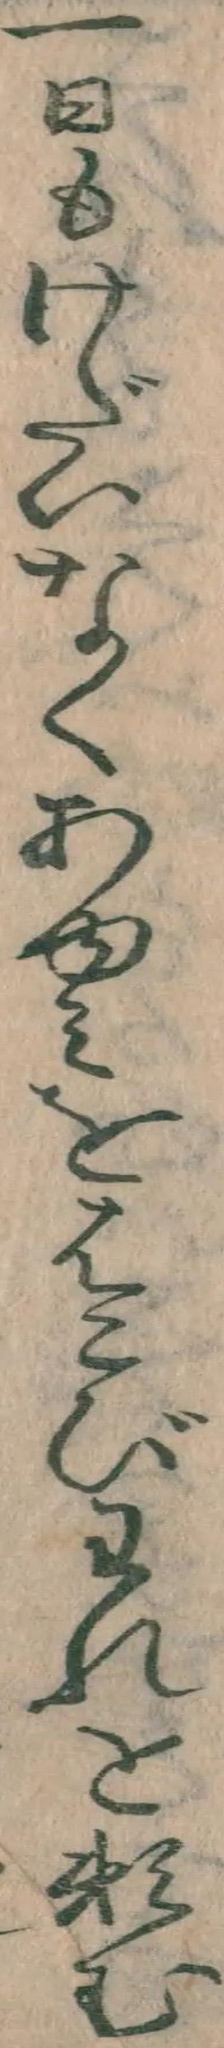一日もけだいなくあゆみをはこびわれと頼む
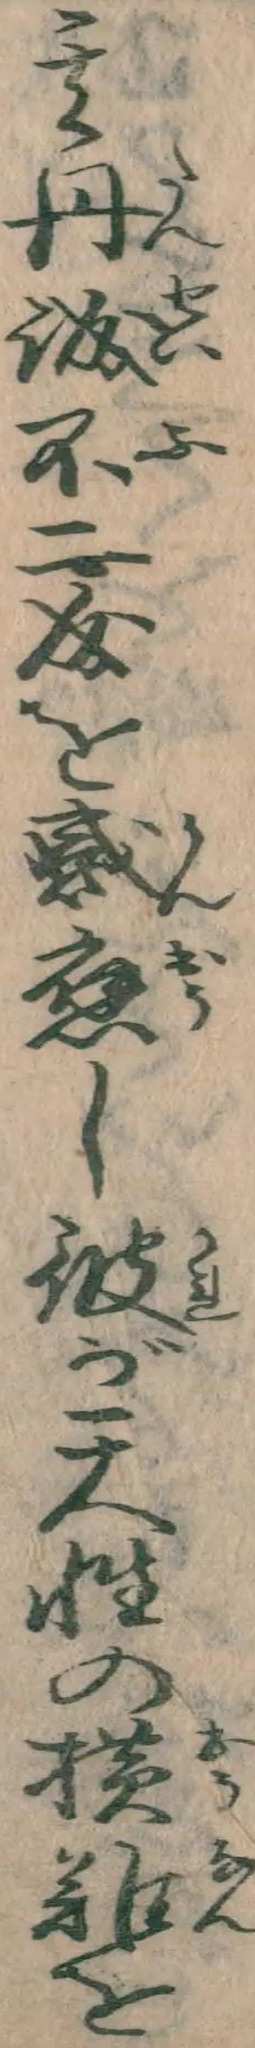其丹誠不二成を感応し彼が天性の横難を
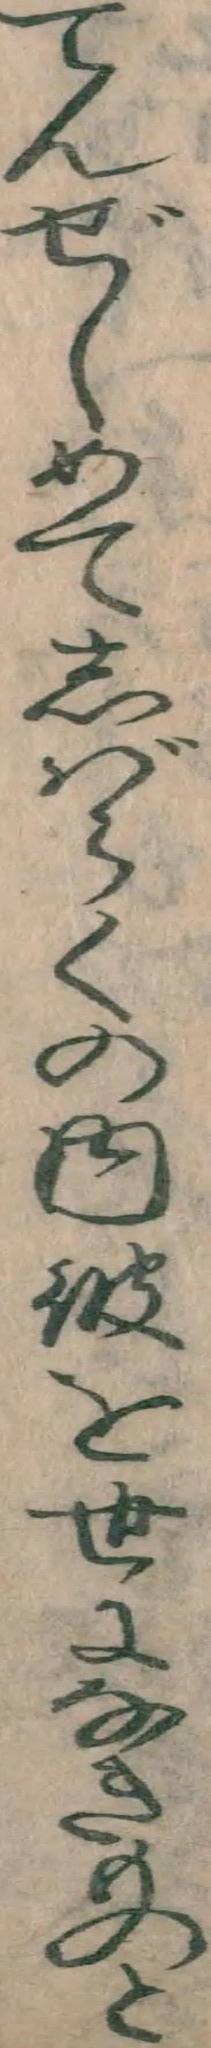てんぜしめてしばらくの内彼を世になきものと
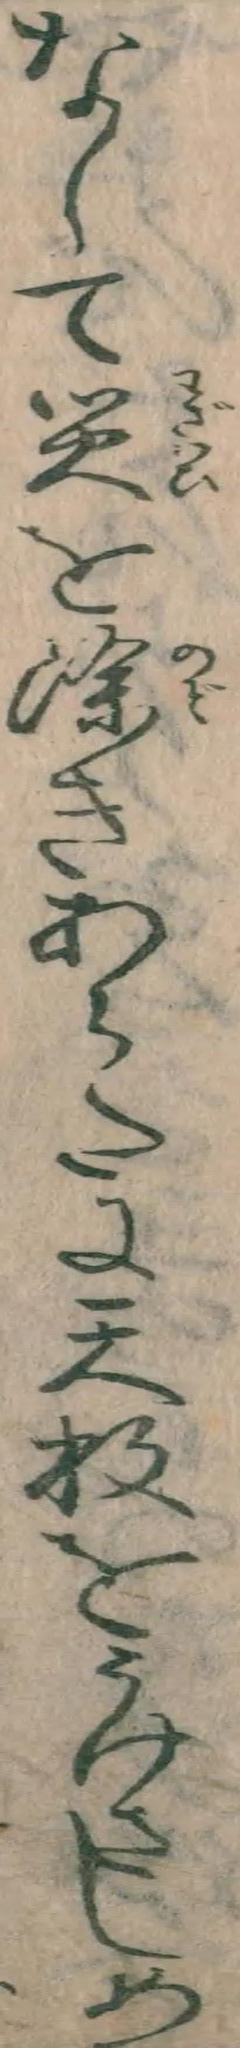なして災を除きあらたに天数をうけさしめ
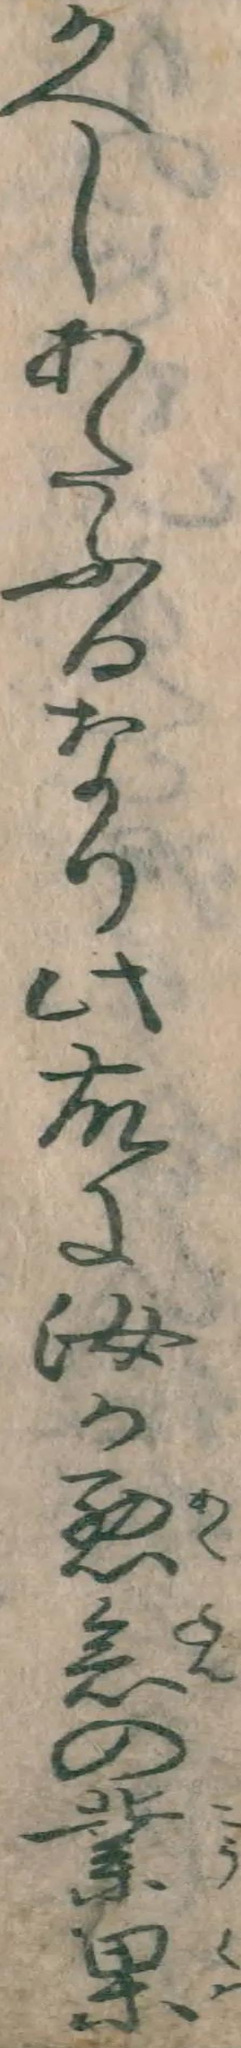かへしあたふるなり此故に汝か悪念の業果
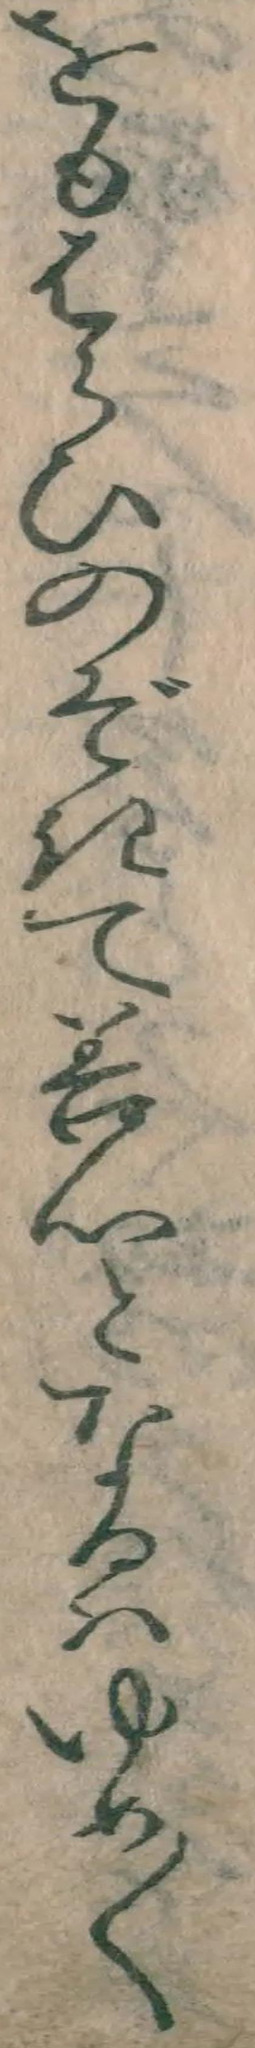をもはらひのぞきて善心となるはゆめ〳〵
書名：怪談御伽童 5巻. [1]
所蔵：国立国会図書館 National Diet Library, JAPAN
